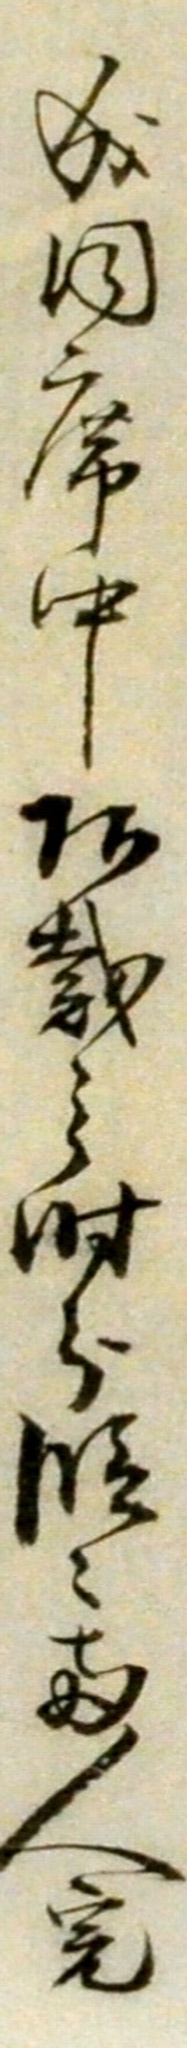成同席中頂戴之時分段々両人宛
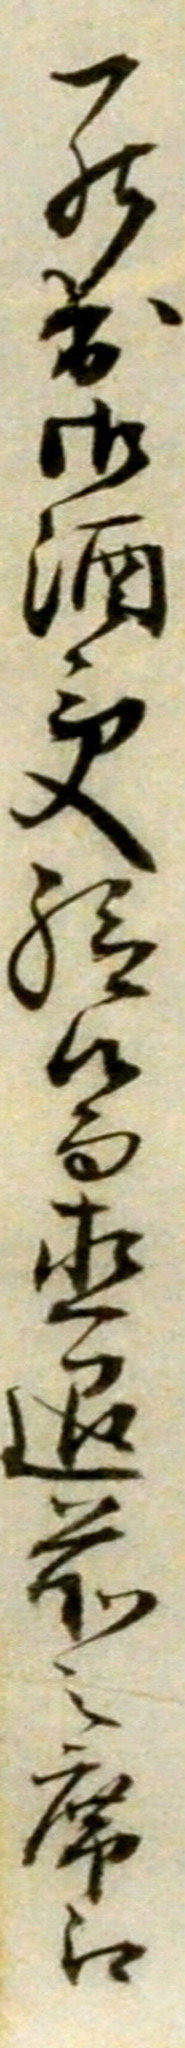罷出御酒受給候て直退前之席え
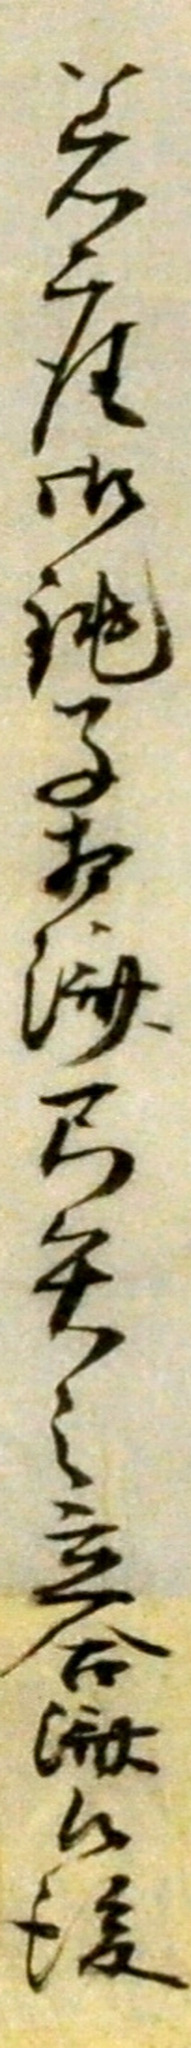着座御銚子相済弓矢之立合済候後
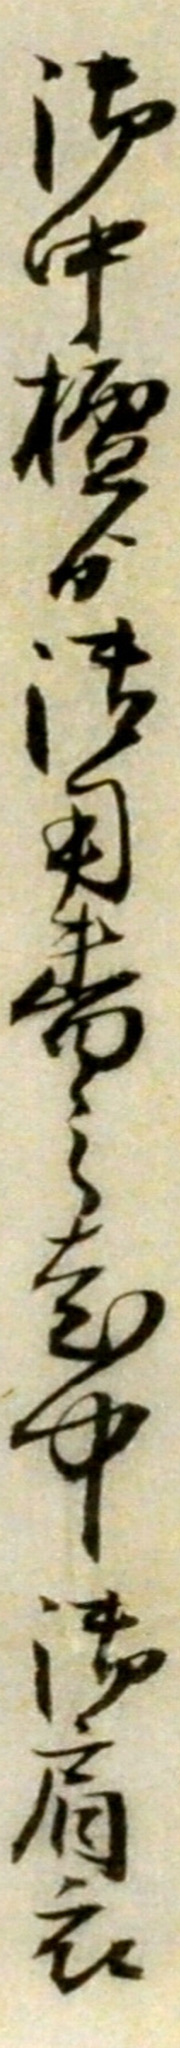御中壇ゟ御用番之老中御肩衣
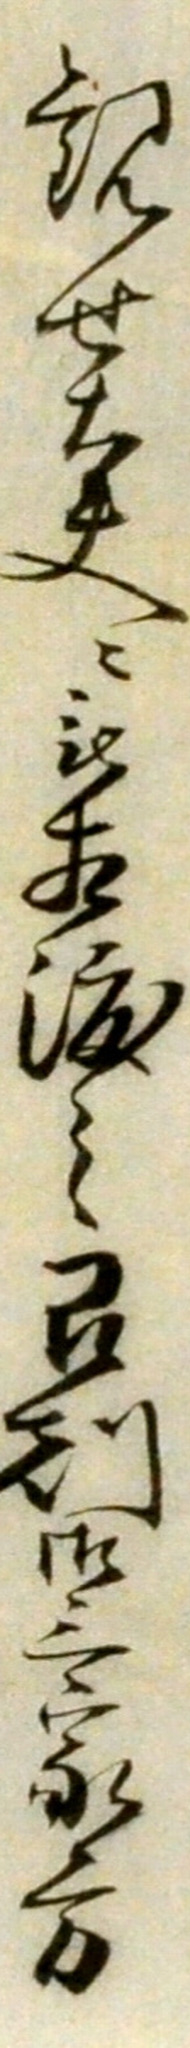観世大夫に被相渡之即刻御三家方
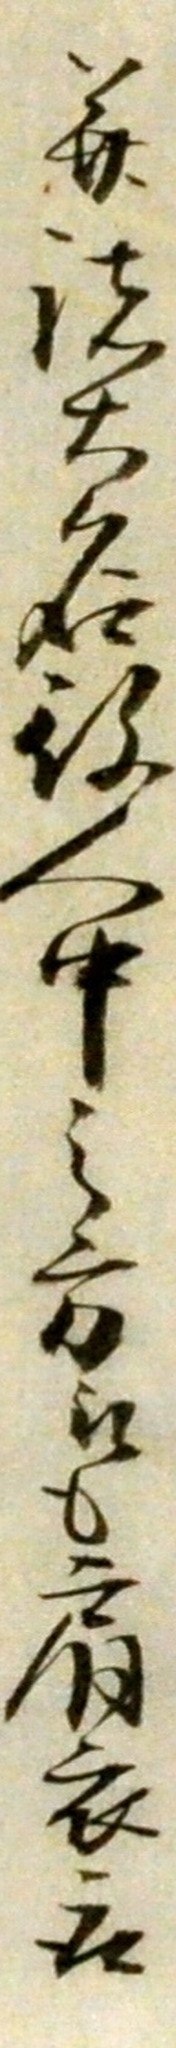并諸大名役人中之方えも肩衣取
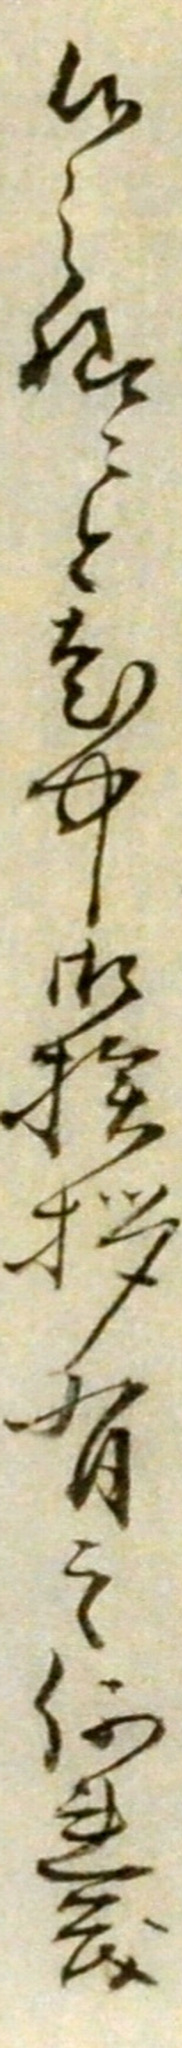候之様にと老中御挨拶有之何れも
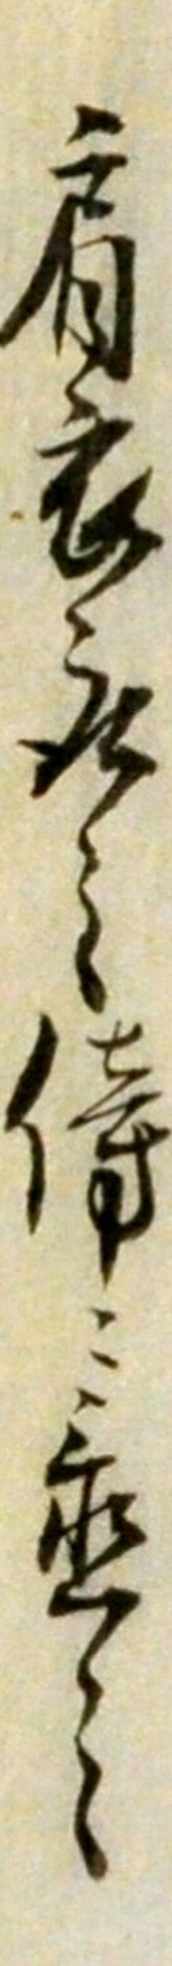肩衣取之傍に置之
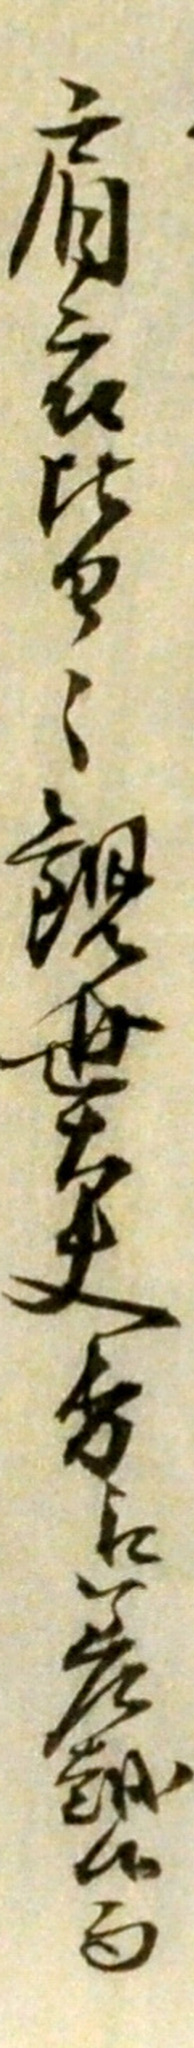肩衣皆々観世大夫方え差越候て
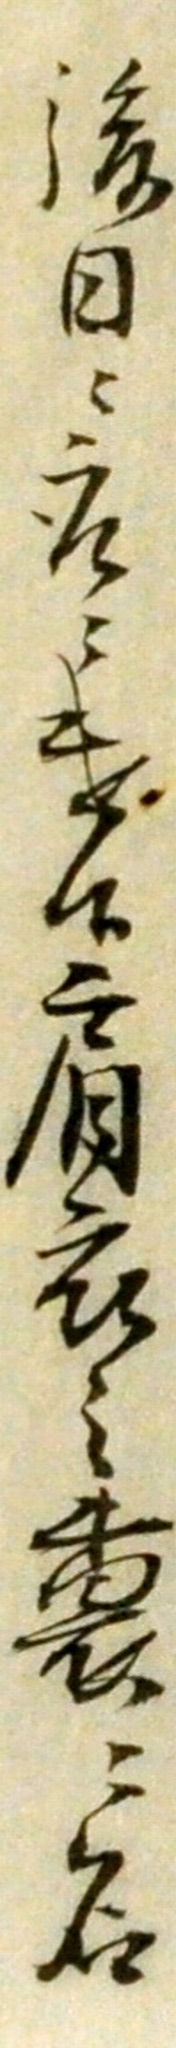後日に取に遣候肩衣之裏に名
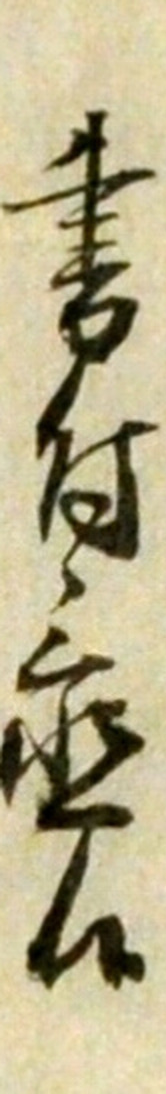書付置候
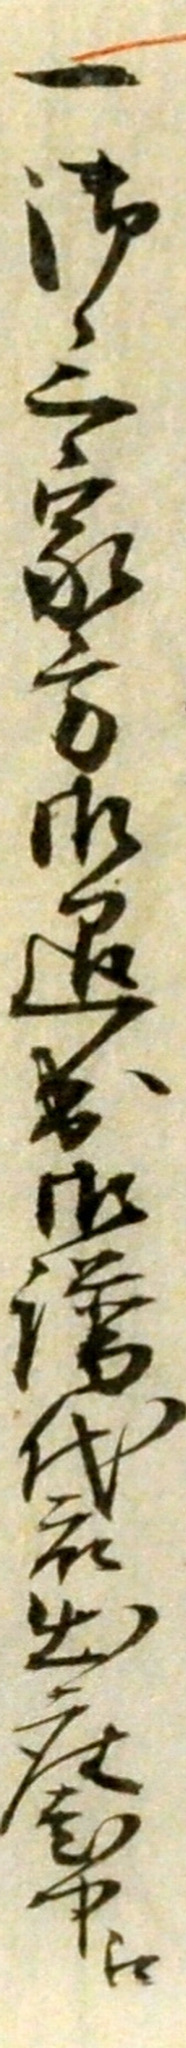一御三家方御退出御譜代衆出座老中え
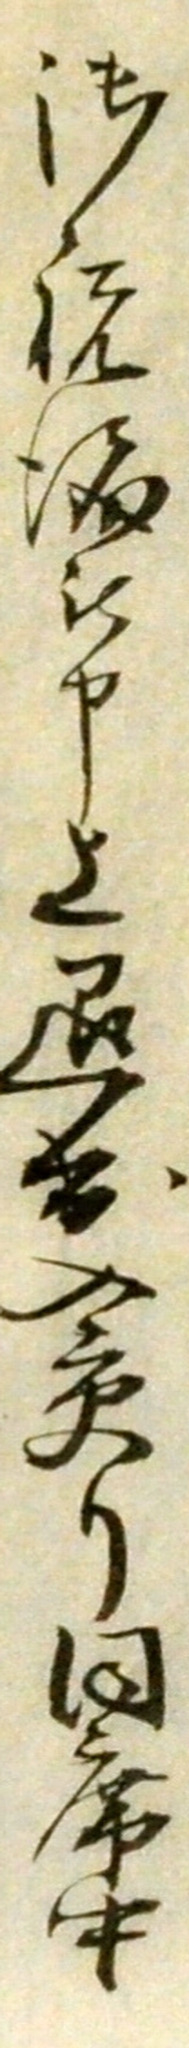御祝儀被申上退出入交り同席中
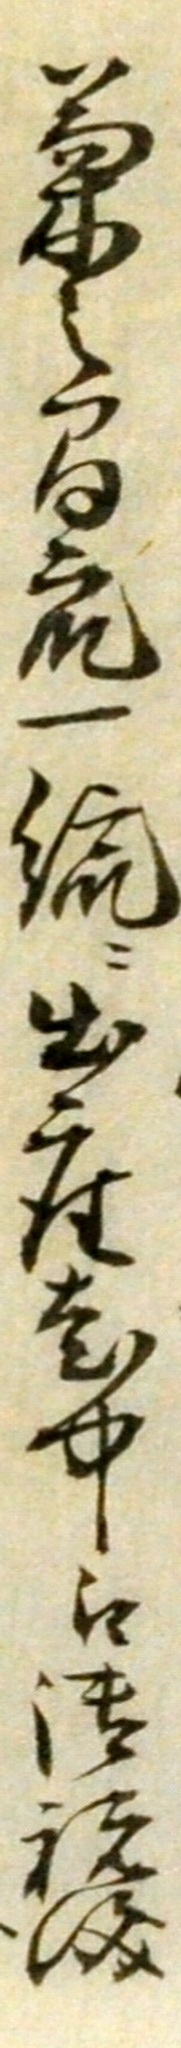菊之間衆一統に出座老中え御祝儀
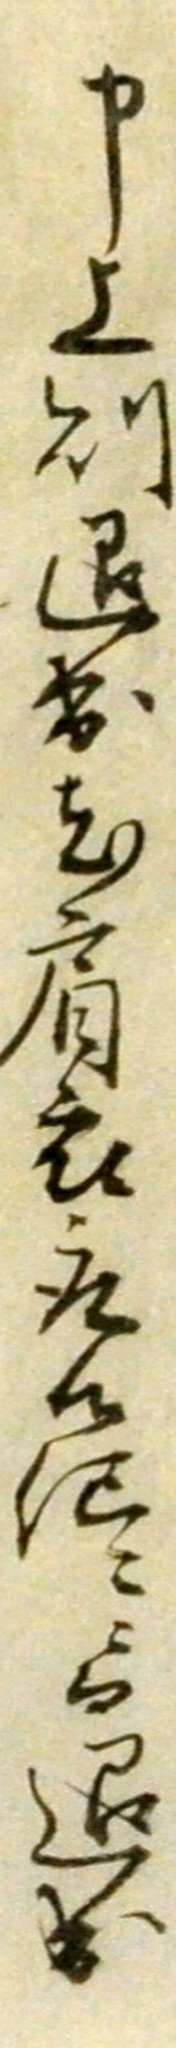申上即退出尤肩衣取候侭にて退出
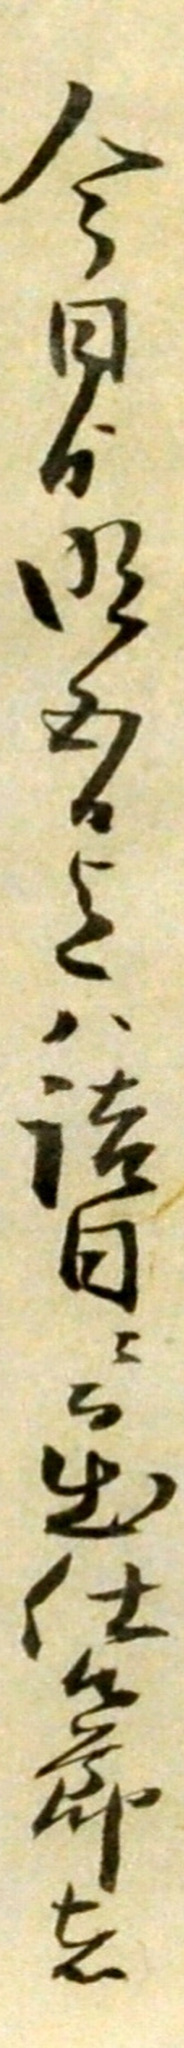一今日ゟ明五日迄は詰日にて出仕候節は
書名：申合帳〔一括〕
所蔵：伊那市立高遠町図書館・合同会社AMANE
